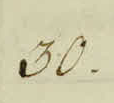30
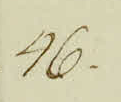46
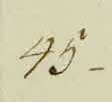45
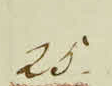25
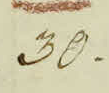30
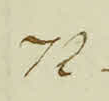72
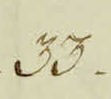33
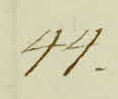44
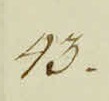43
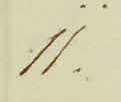11
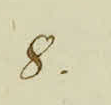8.
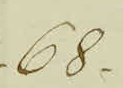68
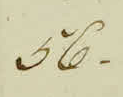56
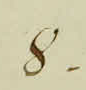8
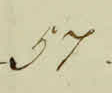57
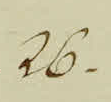26
